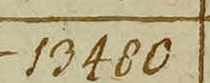13480
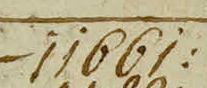11661
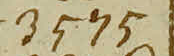3575
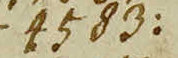4583
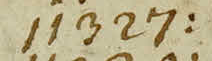11327
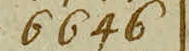6646
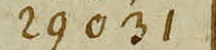29031
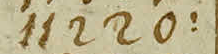11220
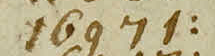16971
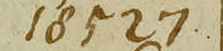18527
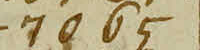7065
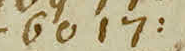6017
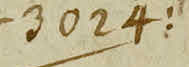3024
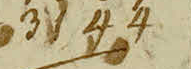3144
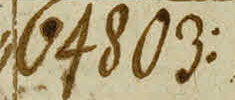64803
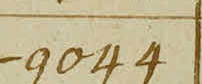9044
